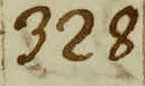328
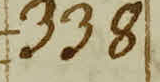338
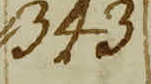343
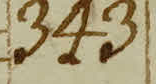343
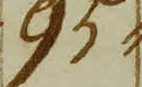95
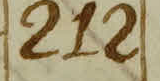212
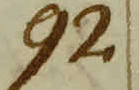92
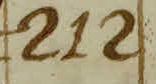212
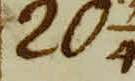20
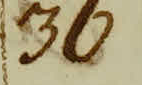36
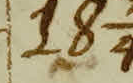10
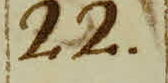22
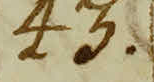43
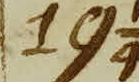19
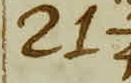21
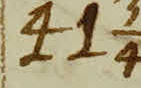41
